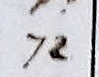72
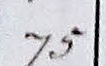75
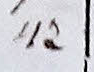42
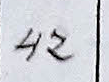42
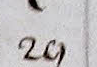29
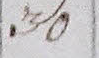30
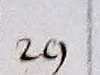29
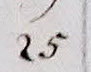25
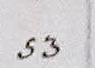53
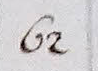62
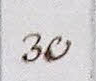30
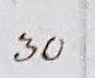30
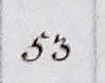53
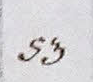53
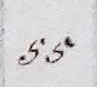55
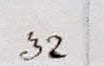32
